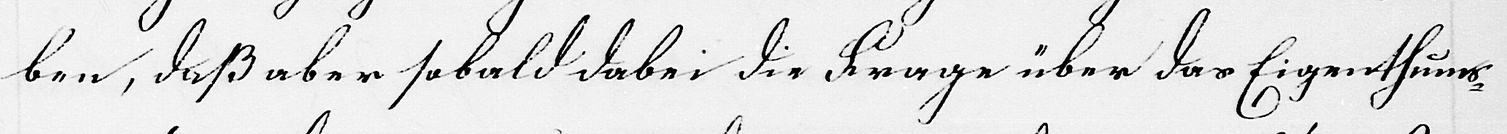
ben, daß aber sobald dabei die Frage über das Eigenthums¬
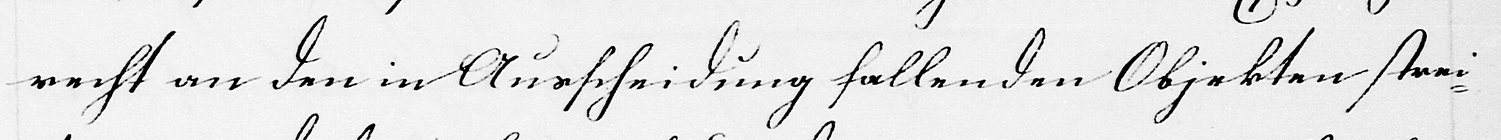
recht an den in Ausscheidung fallenden Objekten strei¬
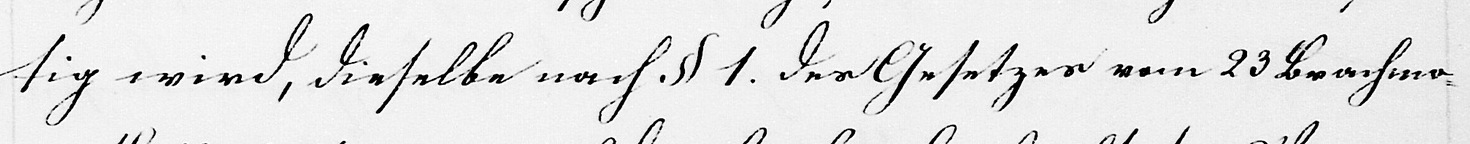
tig wird, dieselbe nach § 1. des Gesetzes vom 23 Brachmo¬
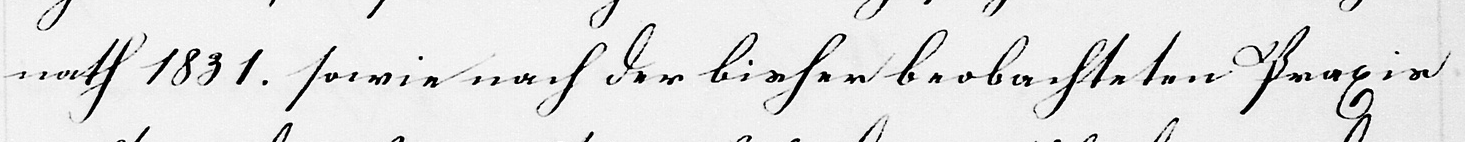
nath 1831. sowie nach der bisher beobachteten Praxis
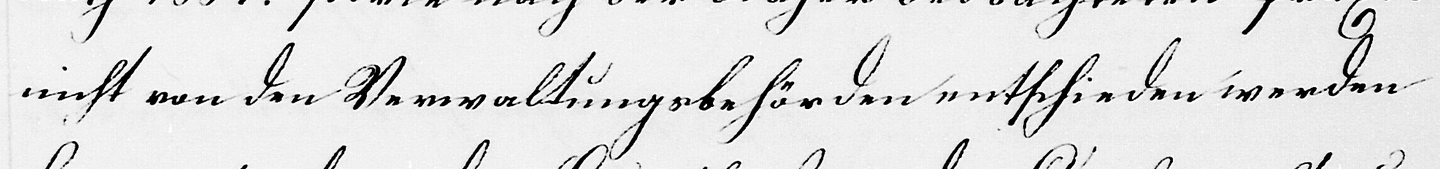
nicht von den Verwaltungsbehörden entschieden werden
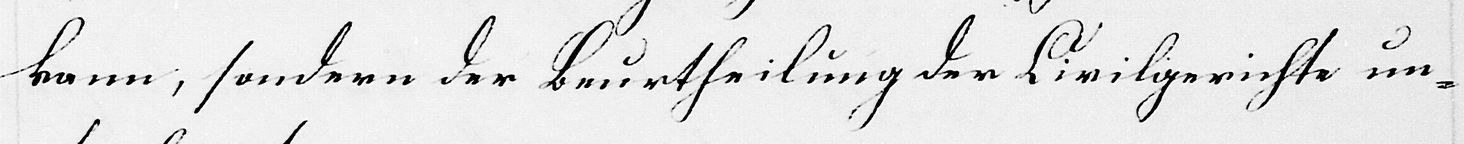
kann, sondern der Beurtheilung der Civilgerichte un¬
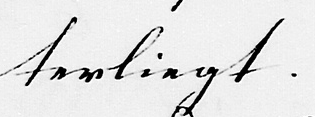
terliegt.
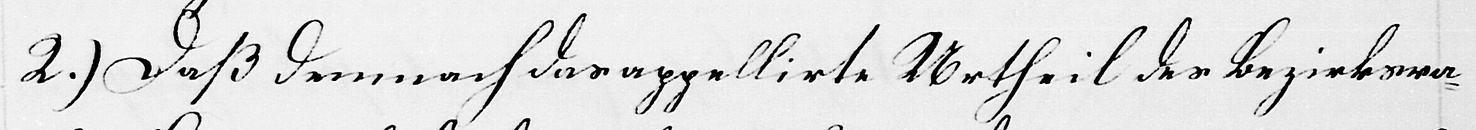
2.) Daß demnach das appellirte Urtheil des Bezirksra¬
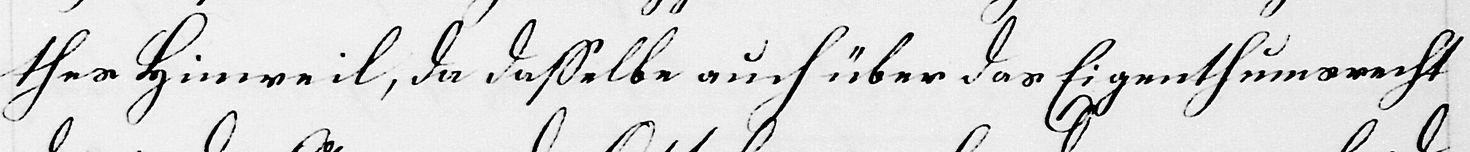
thes Hinweil, da daßelbe auch über das Eigenthumsrecht
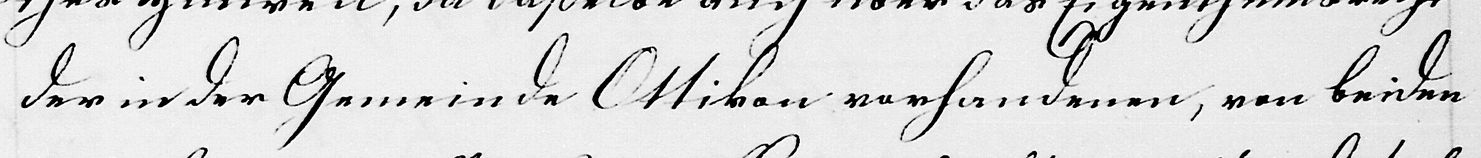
der in der Gemeinde Ottikon vorhandenen, von beiden
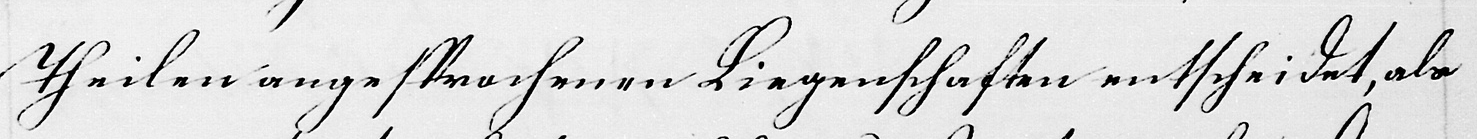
Theilen angesprochenen Liegenschaften entscheidet, als
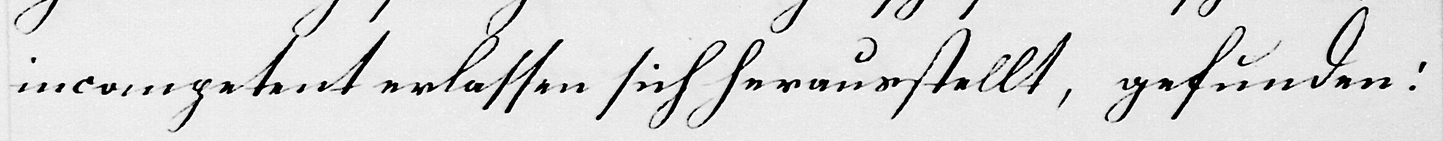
incompetent erlassen sich herausstellt, gefunden:
